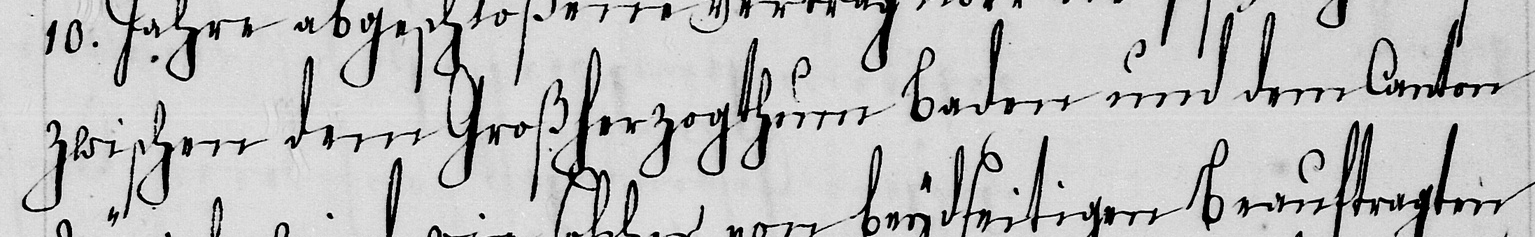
zwischen dem Großherzogthum Baden und dem Canton
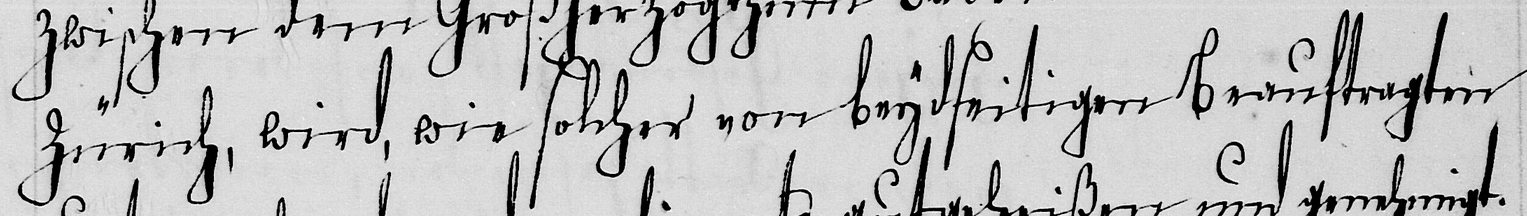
Zürich, wird, wie solcher von beydseitigen Beauftragten
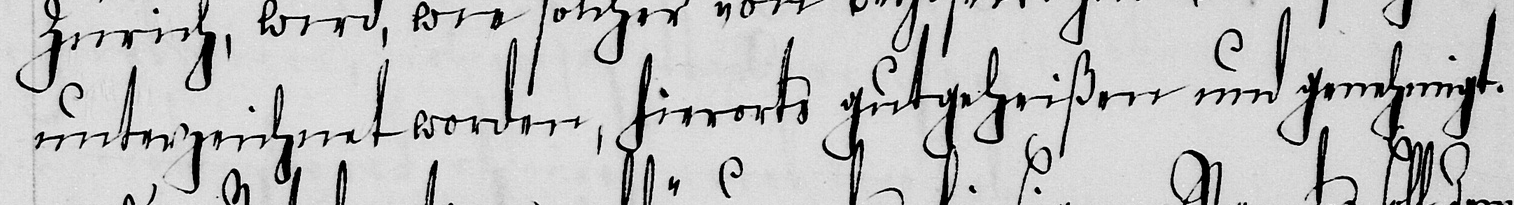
unterzeichnet worden, hierorts gutgeheißen und genehmigt.
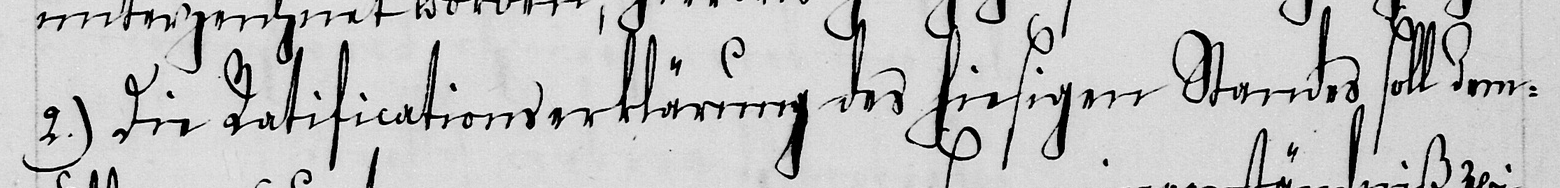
2.) Die Ratificationserklärung des hiesigen Standes soll de¬
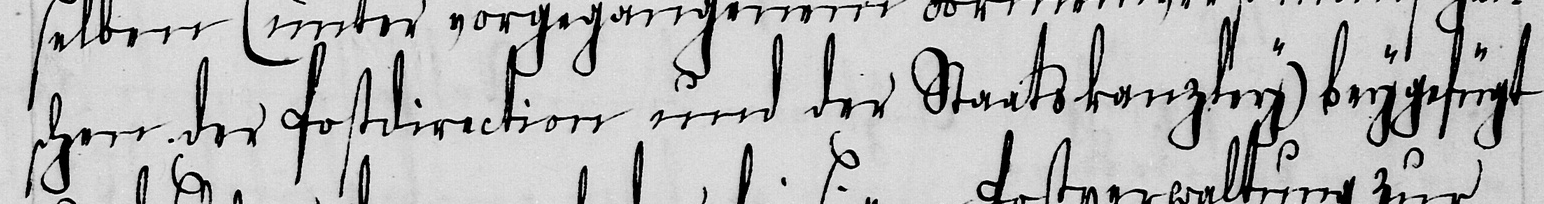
schen der Postdirection und der Staatskanzley) beygefügt
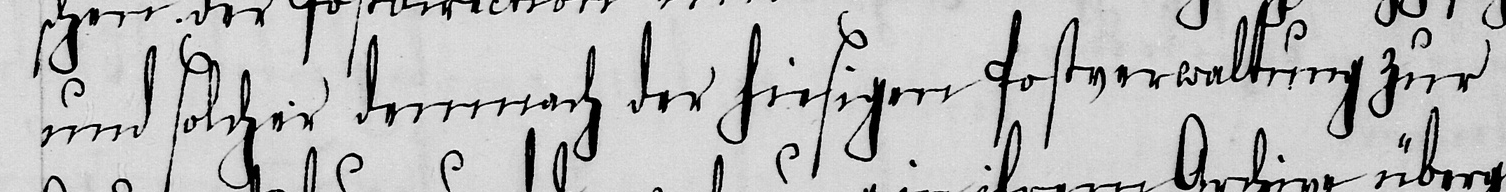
und solcher demnach der hiesigen Postverwaltung zur
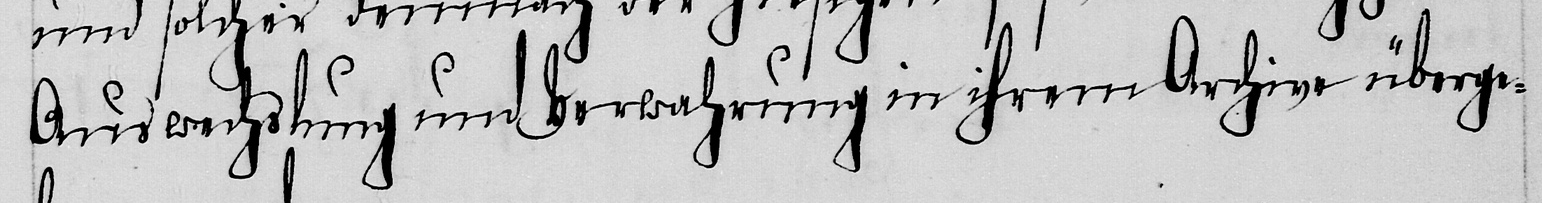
Auswechslung und Verwahrung in ihrem Archive überge¬
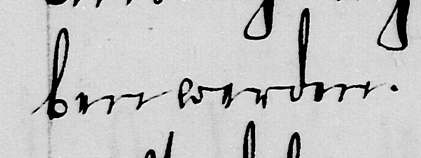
ben werden.
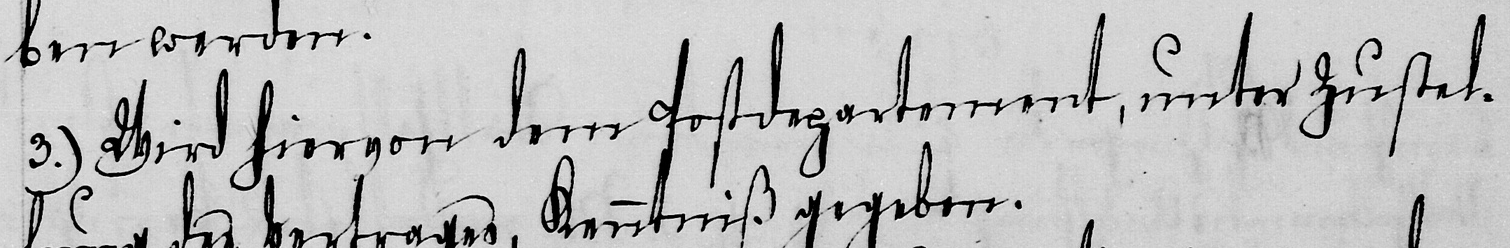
3.) Wird hiervon dem Postdepartement, unter Zustel¬
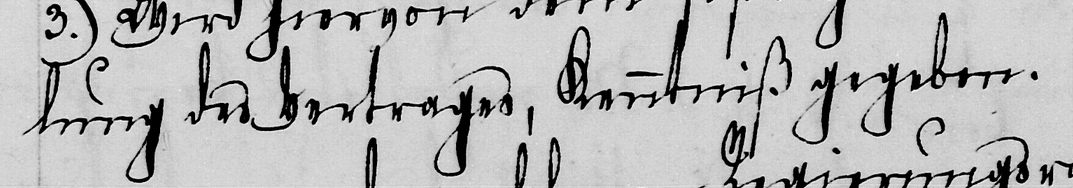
lung des Vertrages, Kenntniß gegeben.
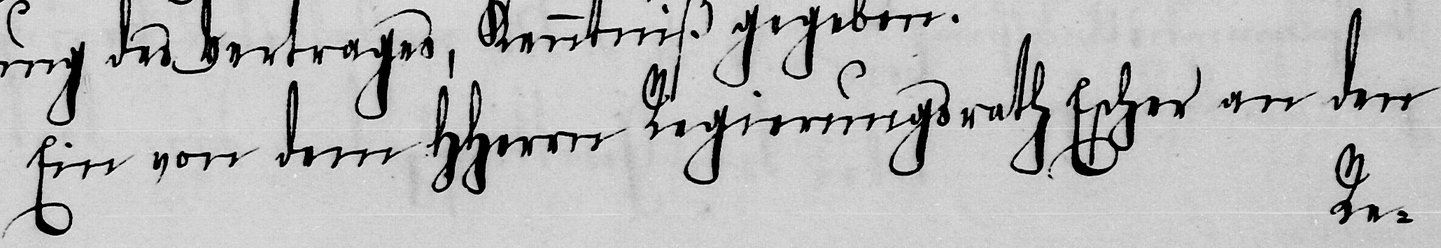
Ein von dem HHerrn Regierungsrath Escher an den
